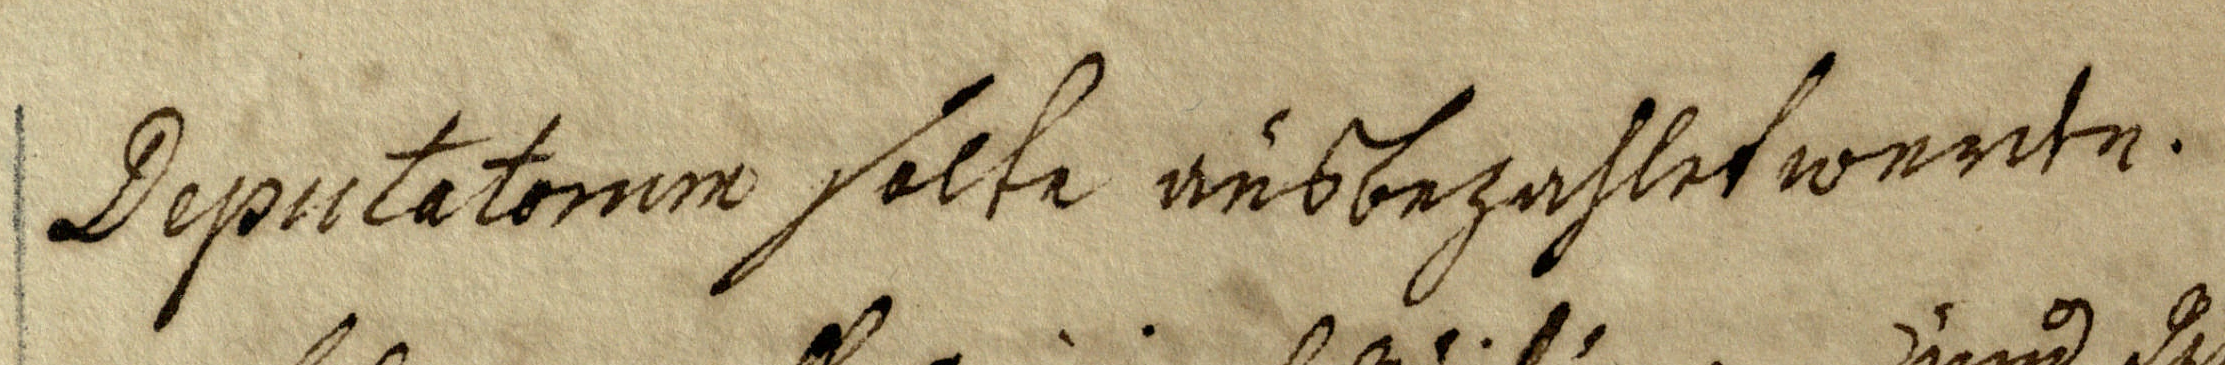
Deputatorum solte ausbezahlt werden.
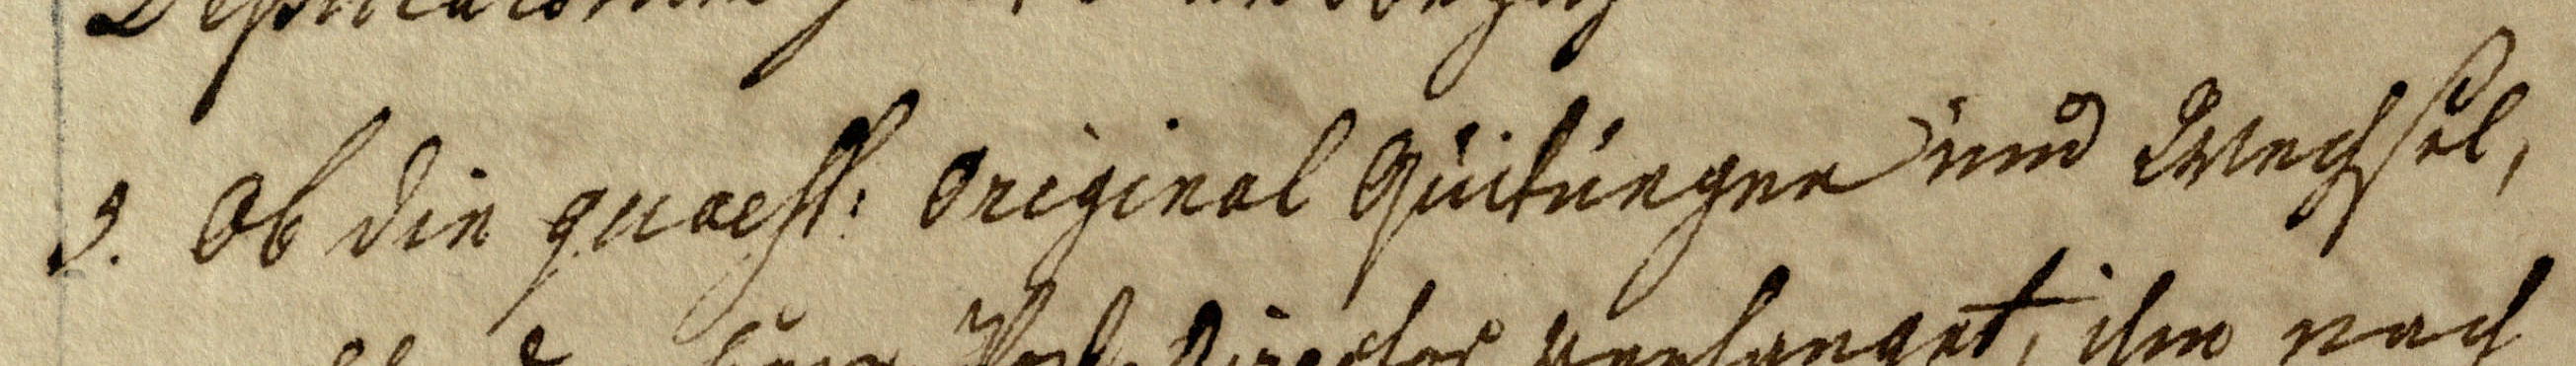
5. ob die quaest. Original Quitungen und Wechsel,
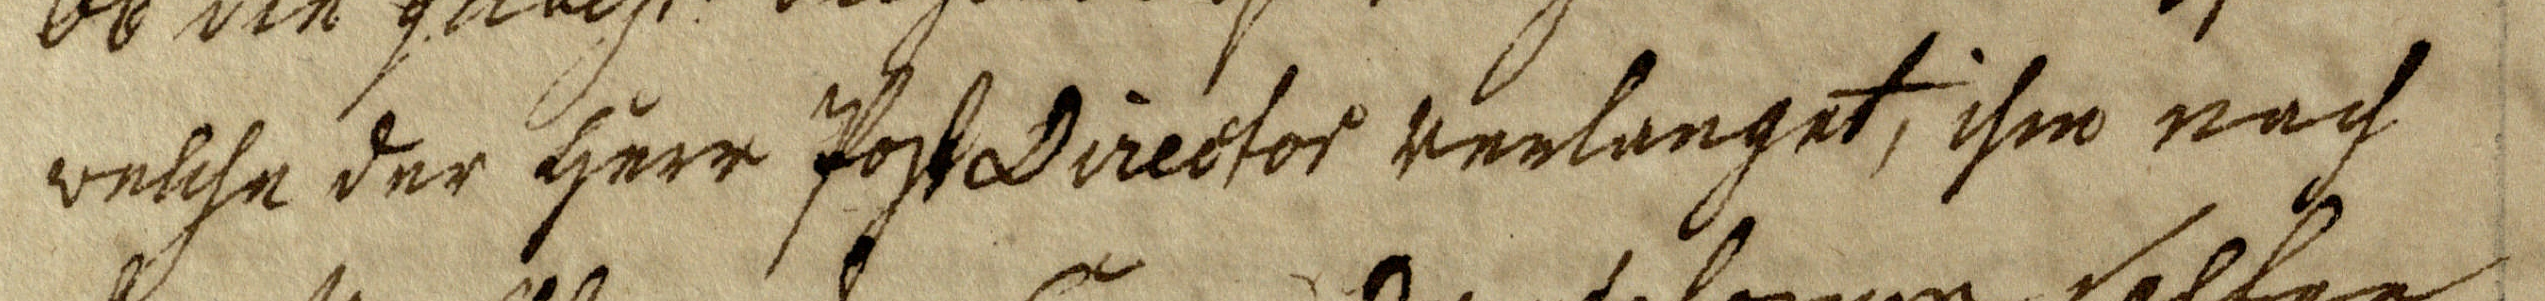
welche der Herr Post Director verlanget, ihm nach
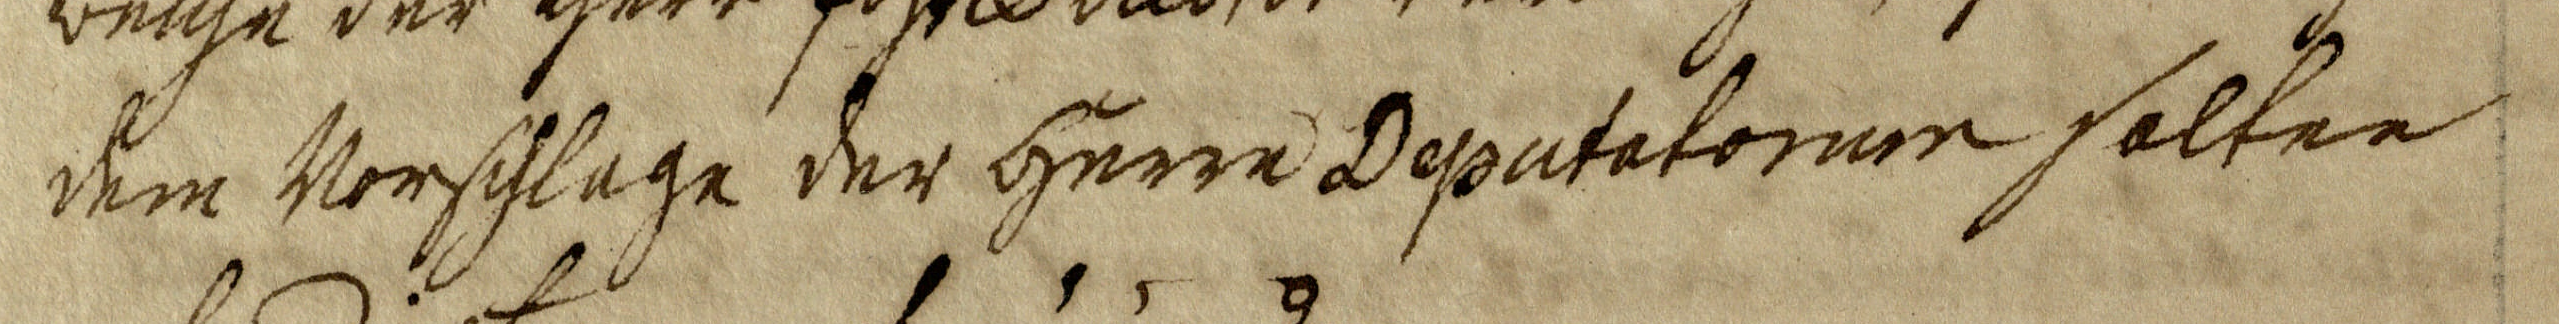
dem Vorschlage der Herrn Deputatorum sollten
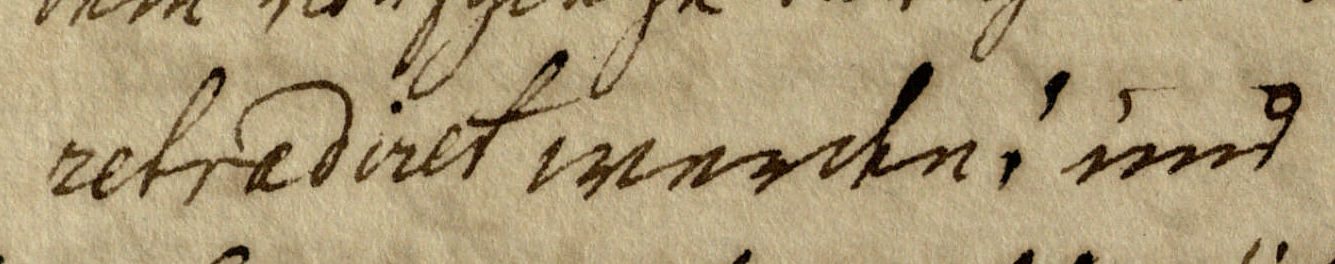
retradirt werden? und
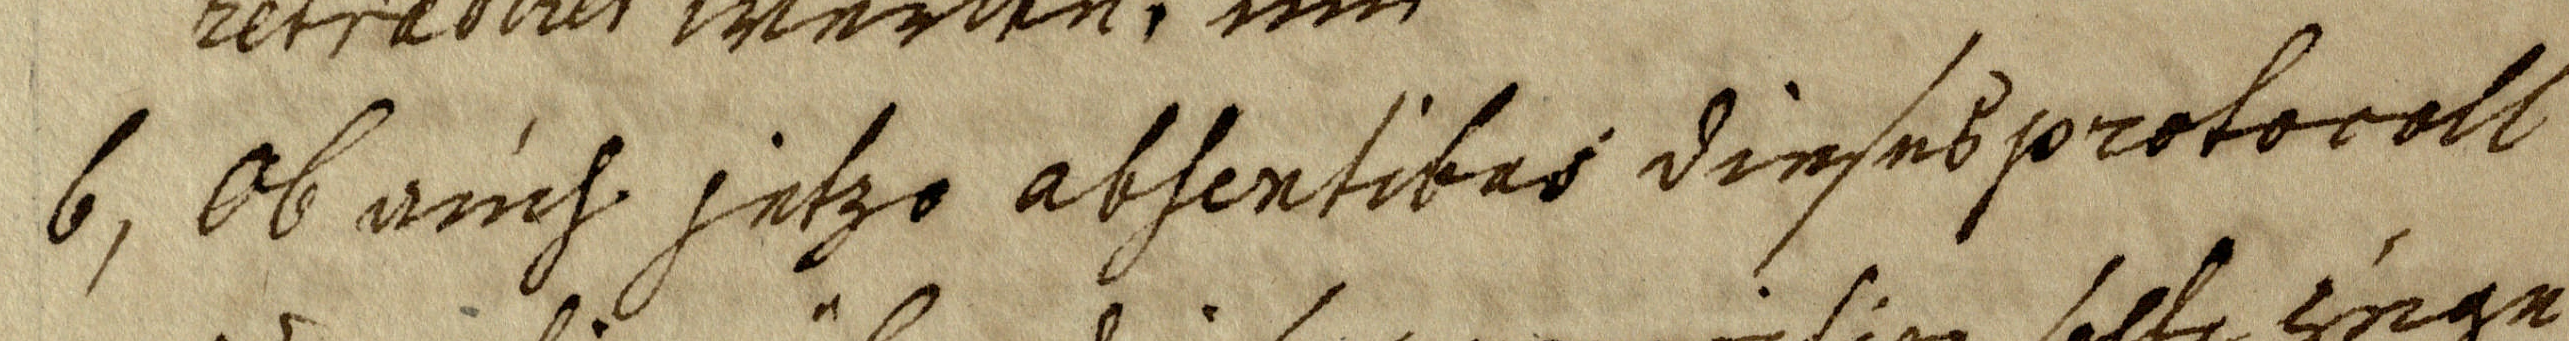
6, ob auch jetzo absentibus dieses protocoll
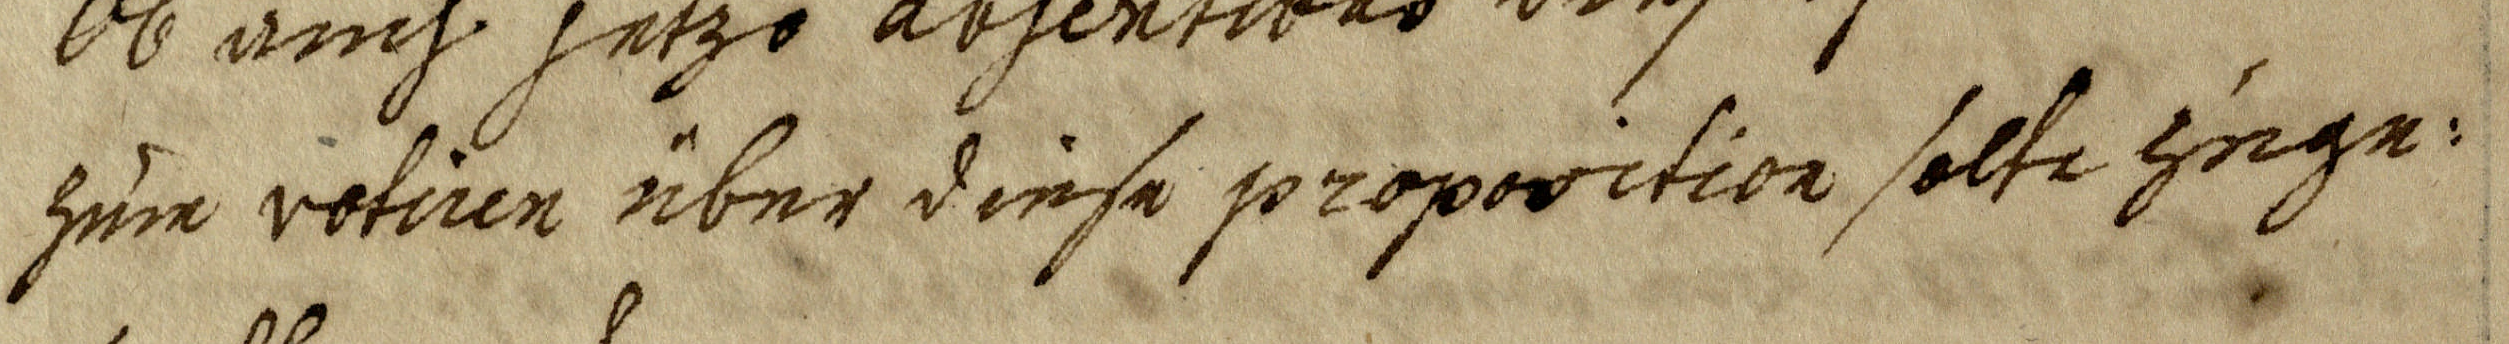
zum votiren über diese proposition solte zuge¬
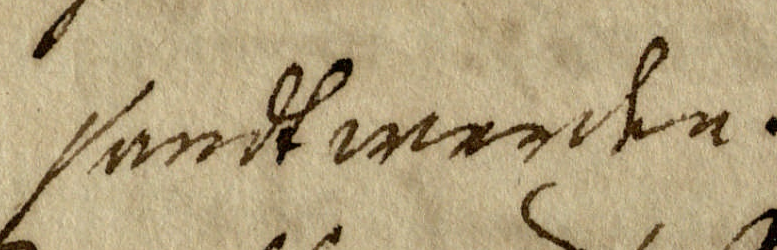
sandt werden.
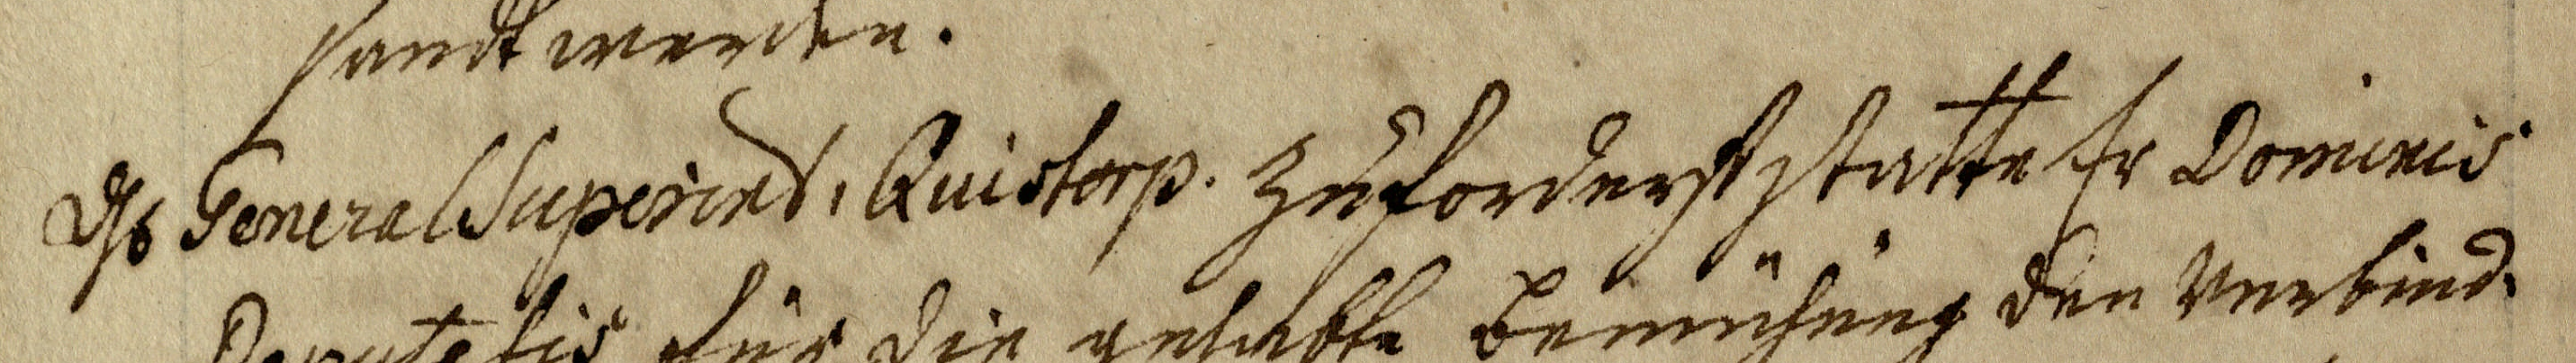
dh GeneralSuperint. Quistorp. zuforderst statte Er Dominis
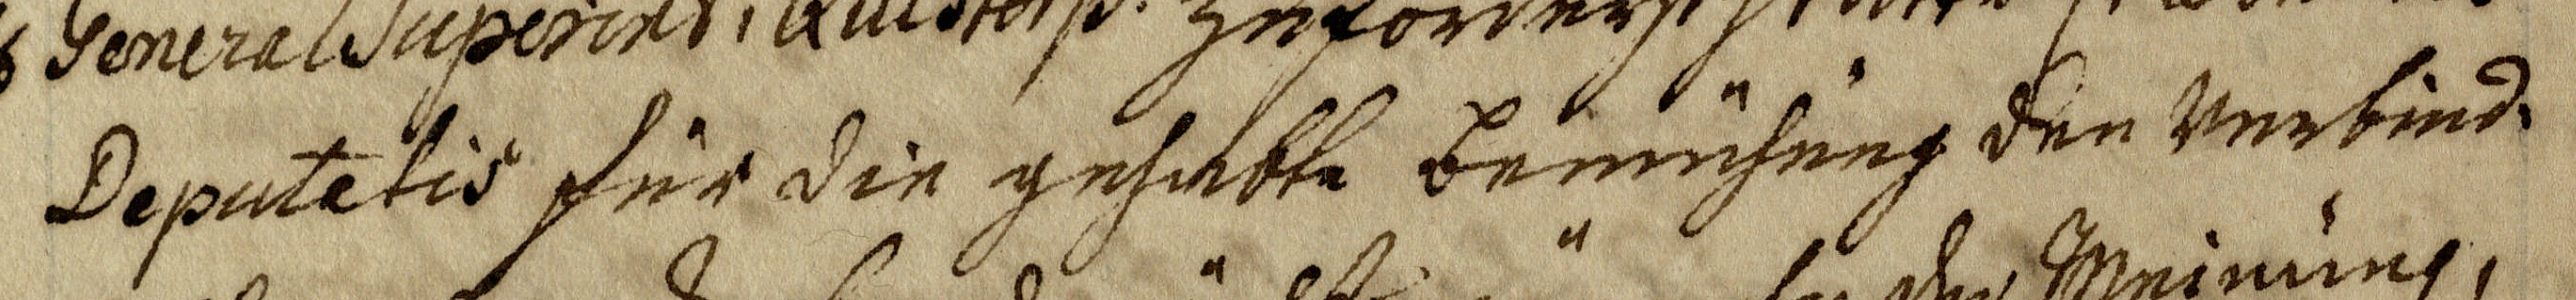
Deputatis für die gehabte Bemühung den verbind¬
